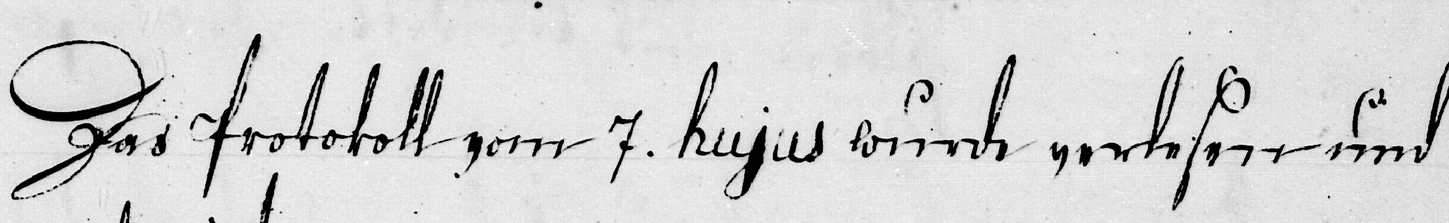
Das Protokoll vom 7. hujus wurde verlesen und
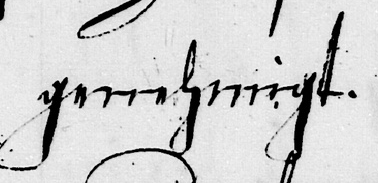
genehmigt.
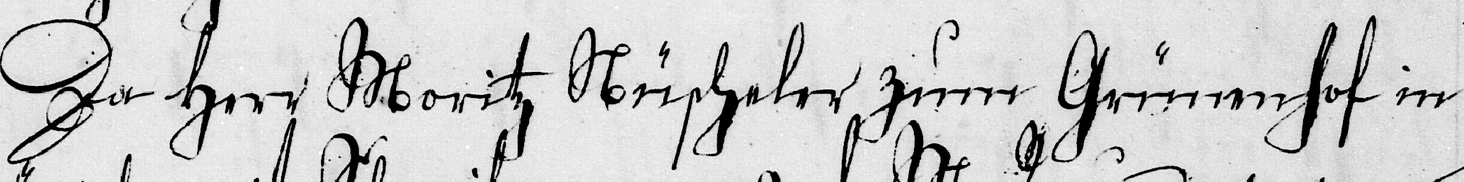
Da Herr Moritz Nüscheler zum Grünenhof in
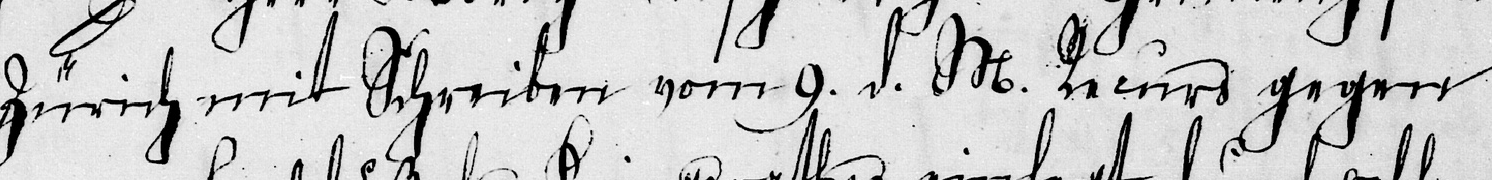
Zürich mit Schreiben vom 9. d. M. Recurs gegen
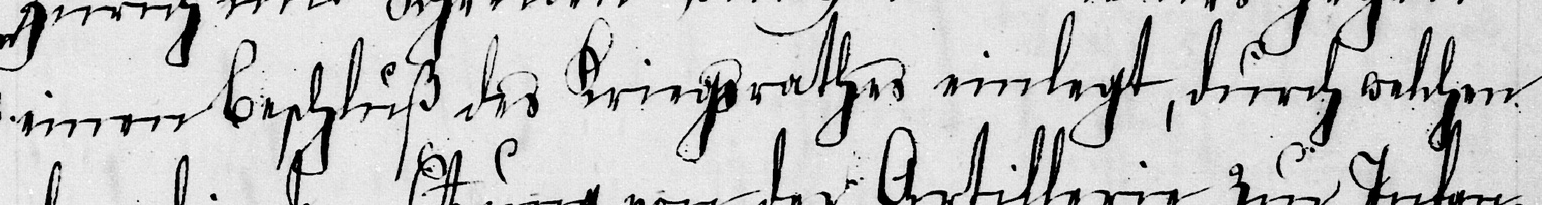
einen Beschluß des Kriegsrathes einlegt, durch welchen
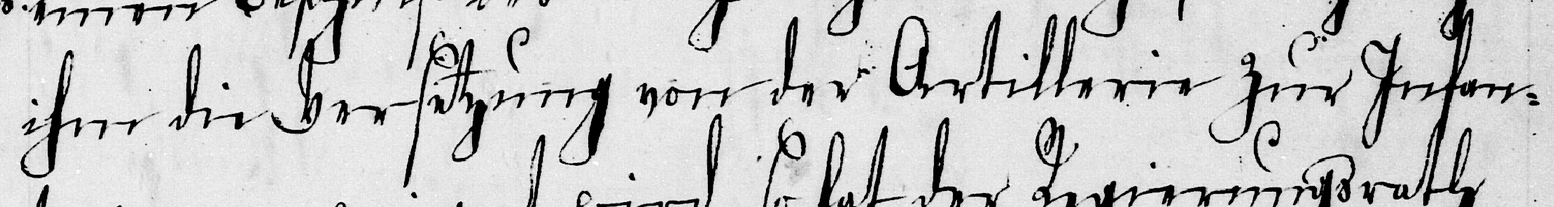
ihm die Versetzung von der Artillerie zur Infan¬
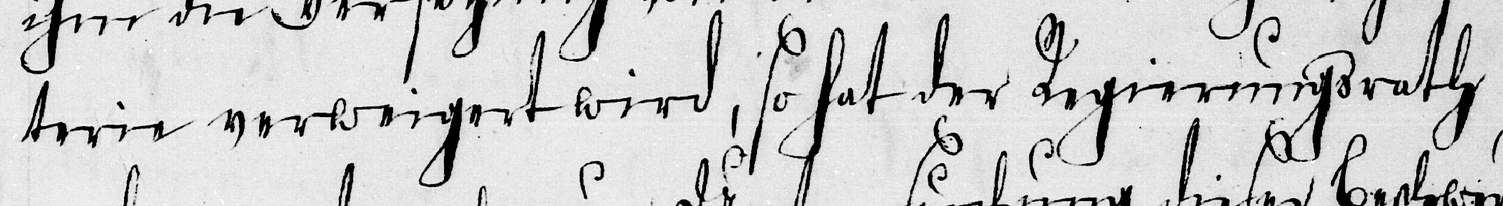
terie verweigert wird, so hat der Regierungsrath
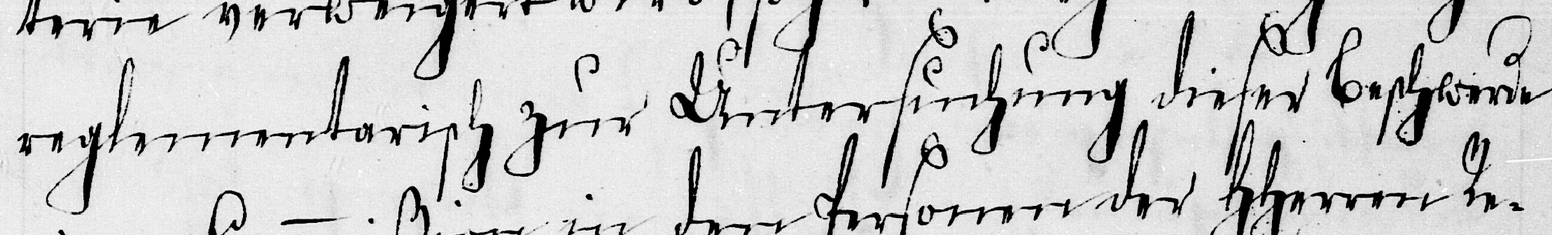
reglementarisch zur Untersuchung dieser Beschwerde
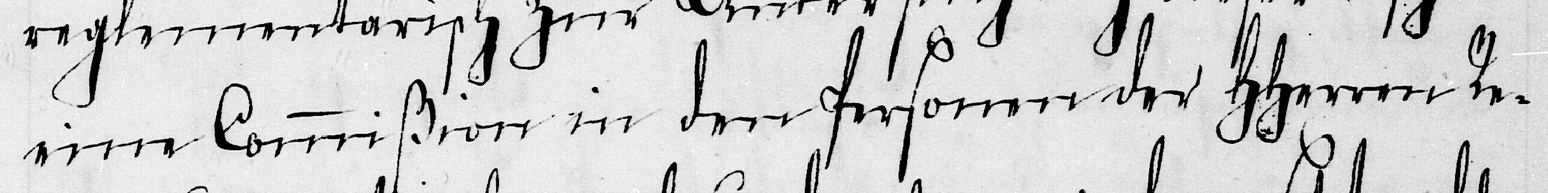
eine Commißion in den Personen der HHerren Re¬
